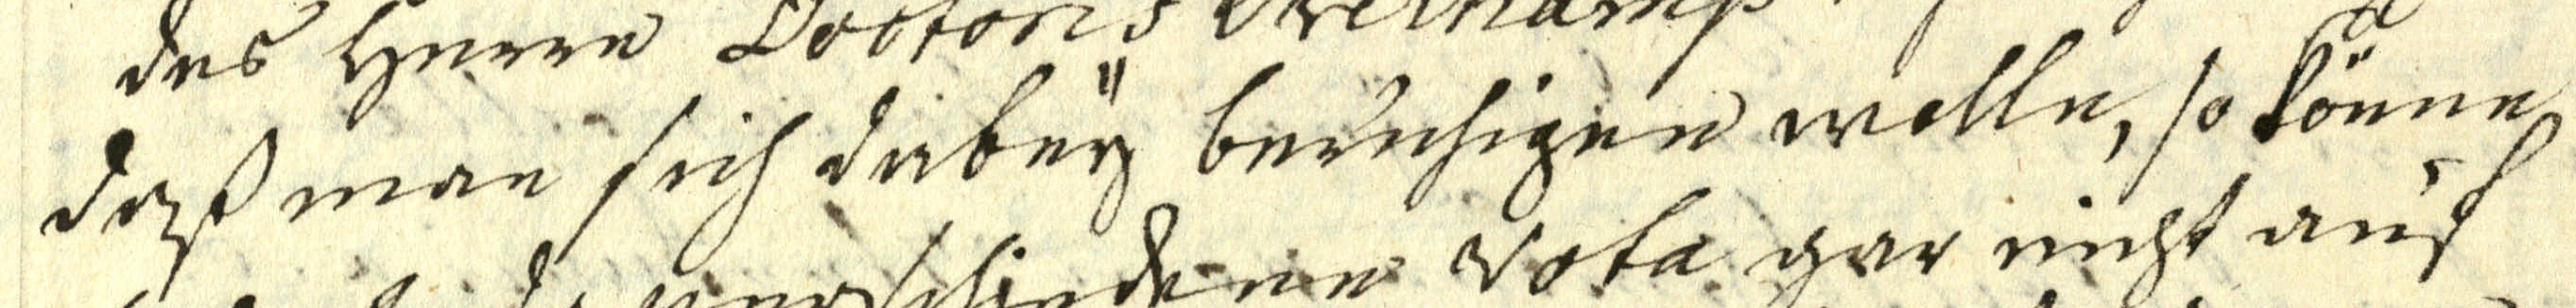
daß man sich dabeÿ beruhigen wolle, so könne
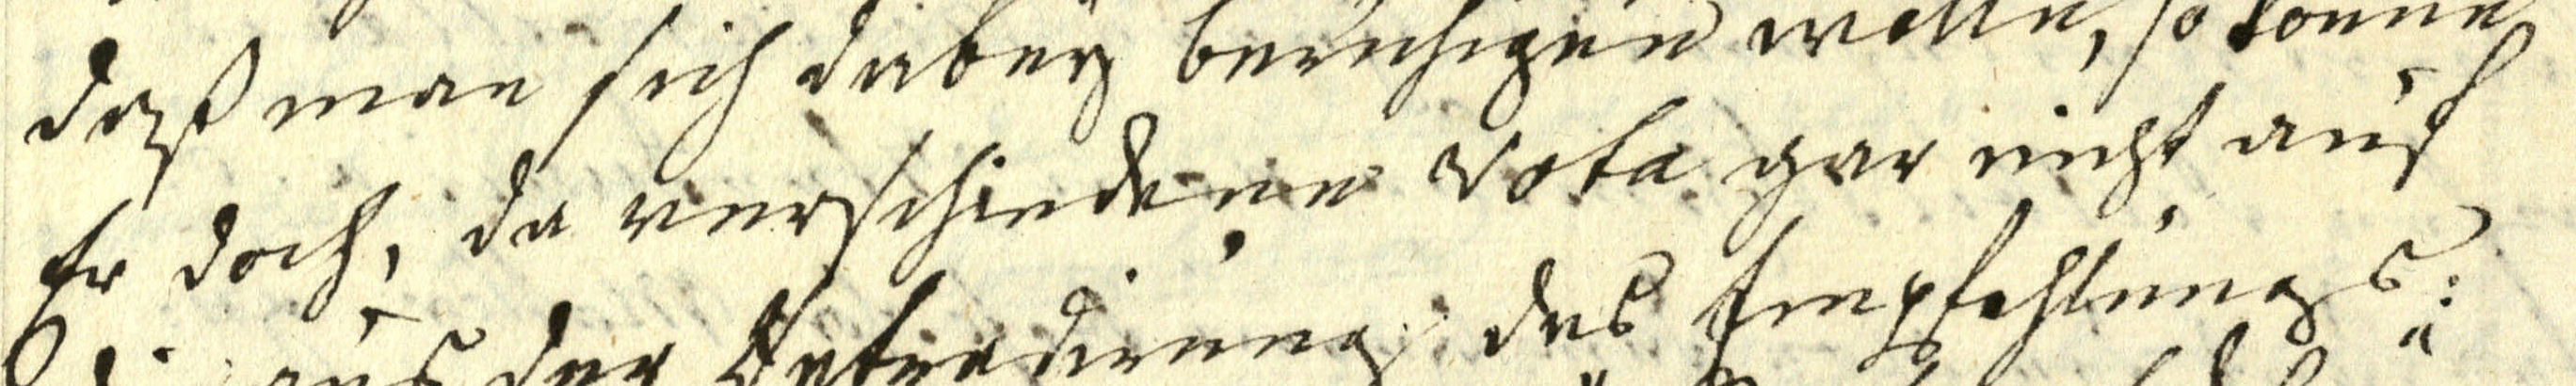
Er doch, da verschiedene Vota gar nicht auf
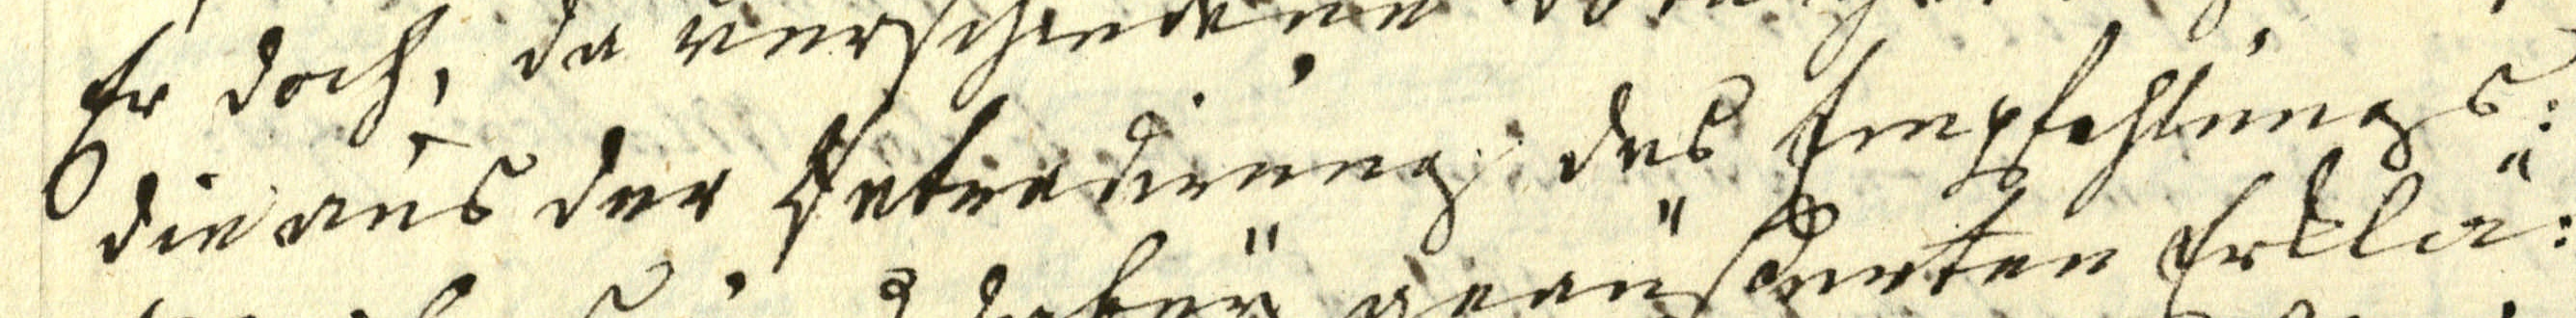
die aus der Retradirung des Empfehlungs¬
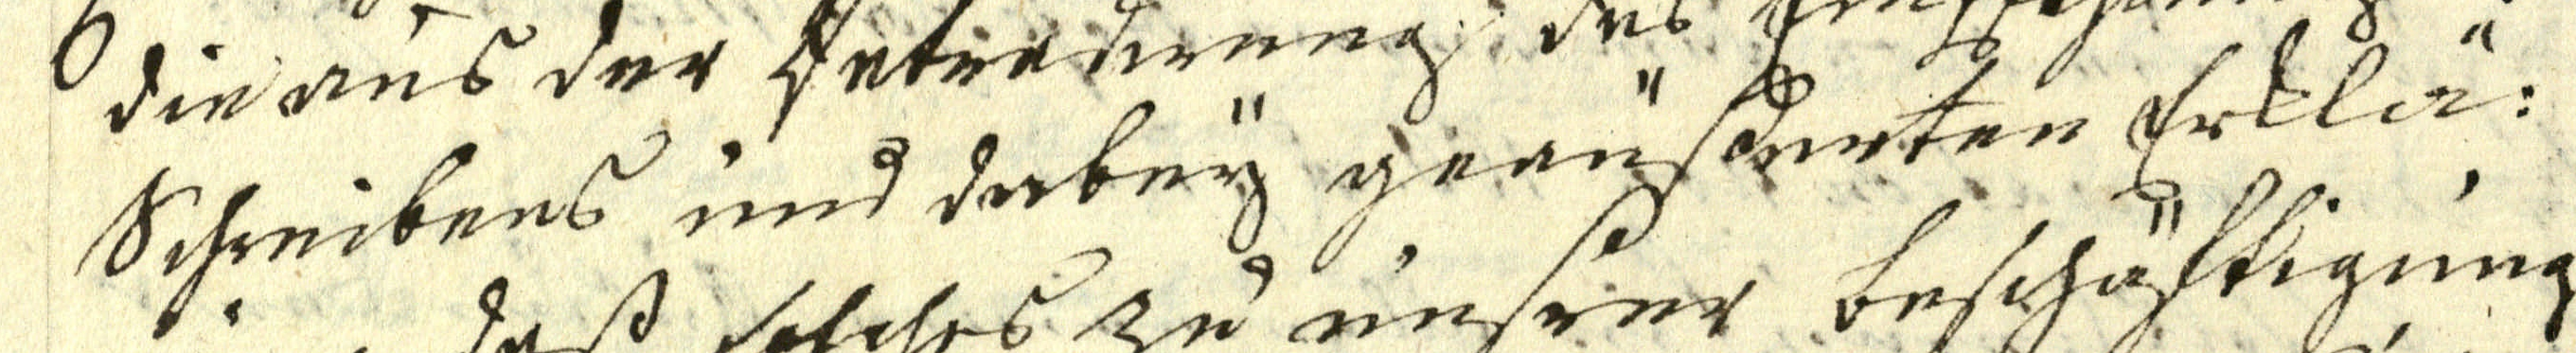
Schreibens und dabeÿ geäußerten Erklä¬
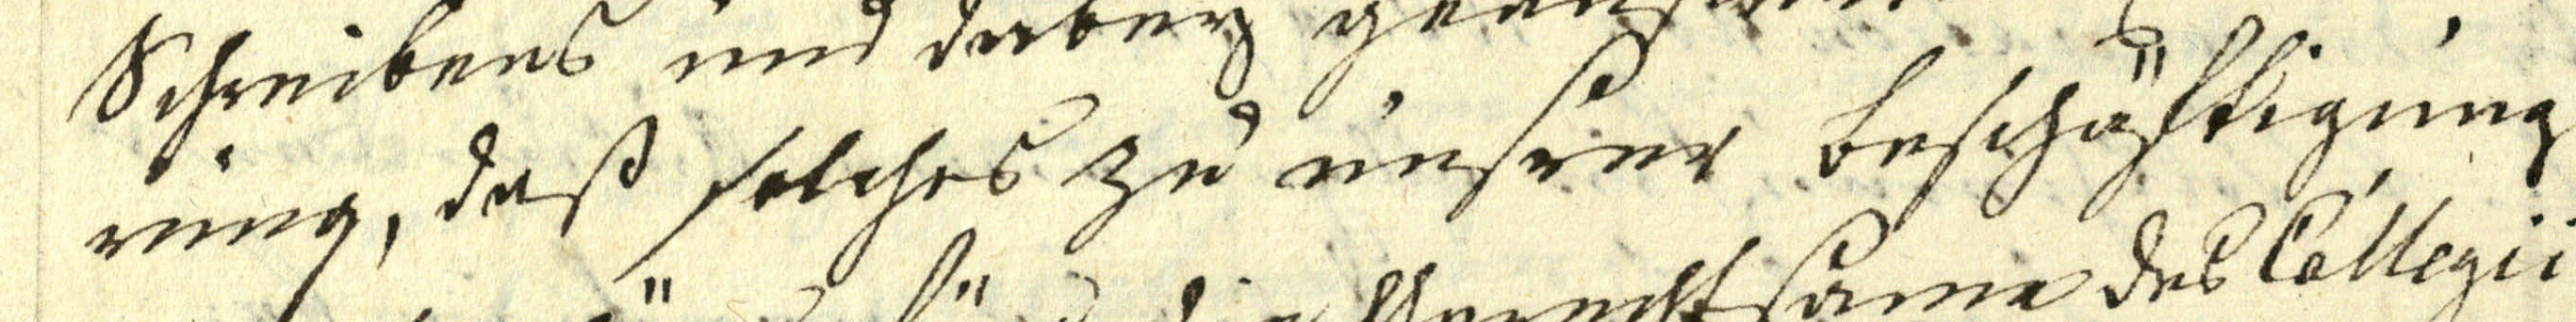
rung, daß solches zu unsrer Beschäftigung
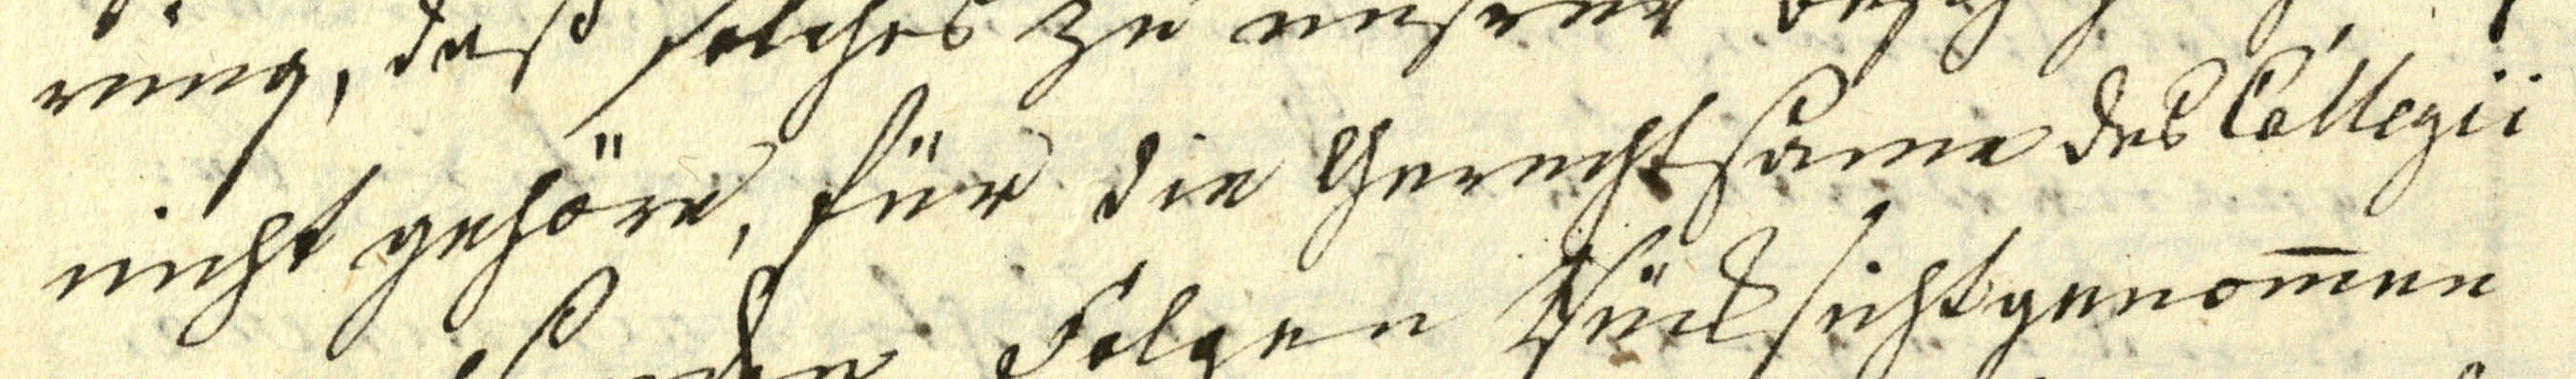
nicht gehöre, für die Gerechtsame des Collegii
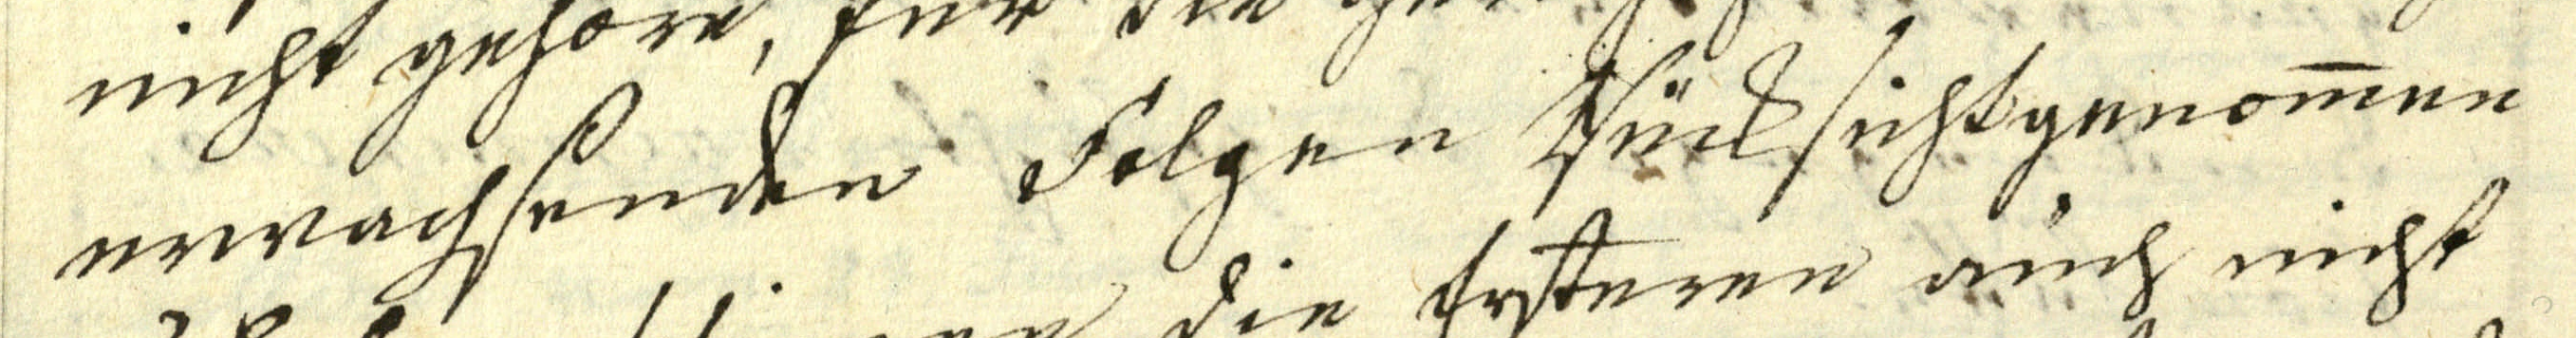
erwachsenden Folgen Rücksicht genomen
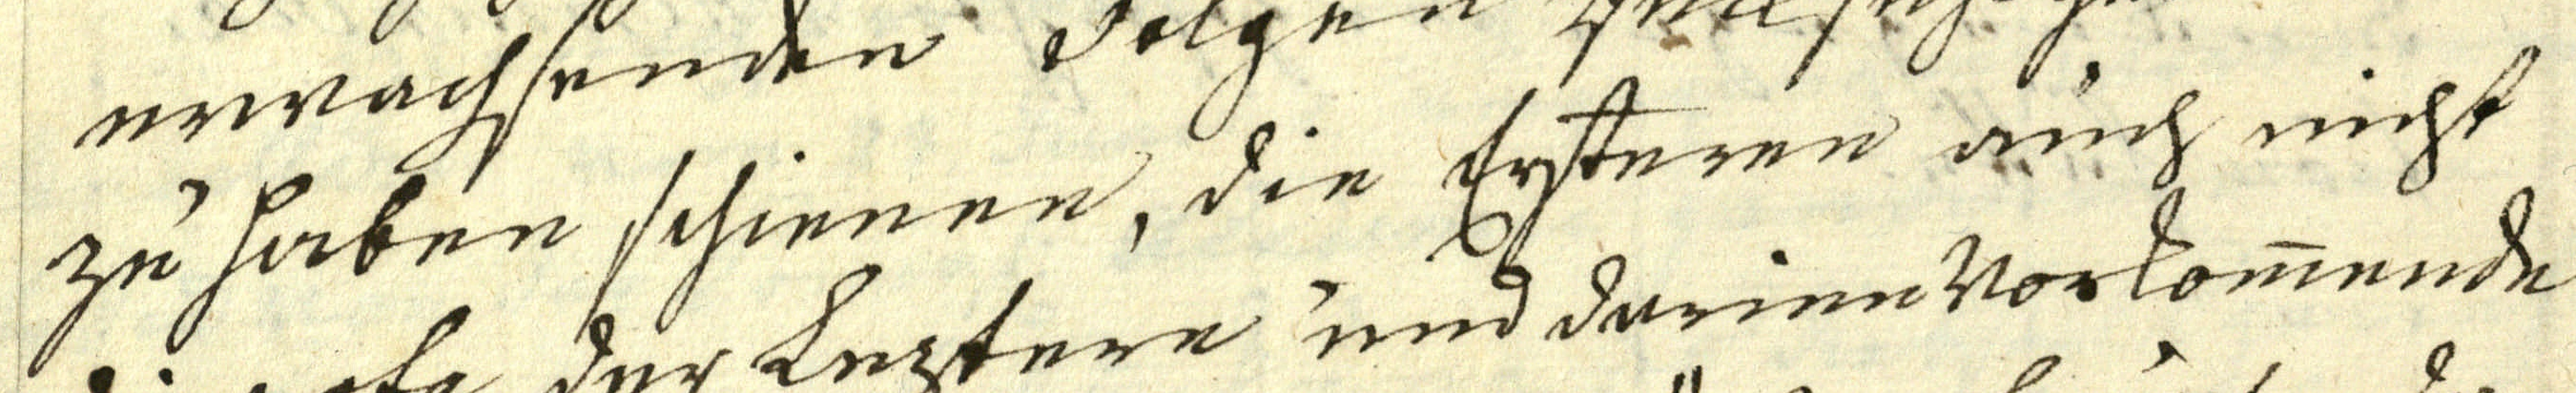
zu haben schienen, die Ersteren auch nicht
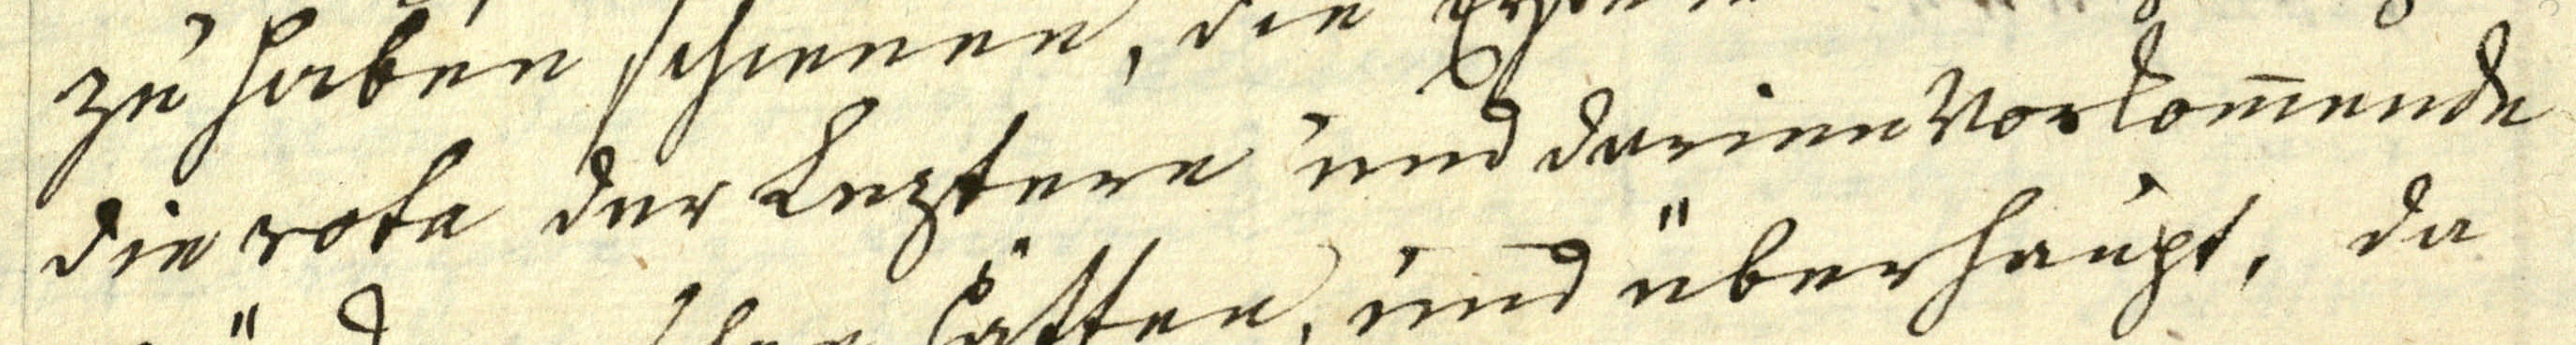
die vota der Leztern und darin vorkomende
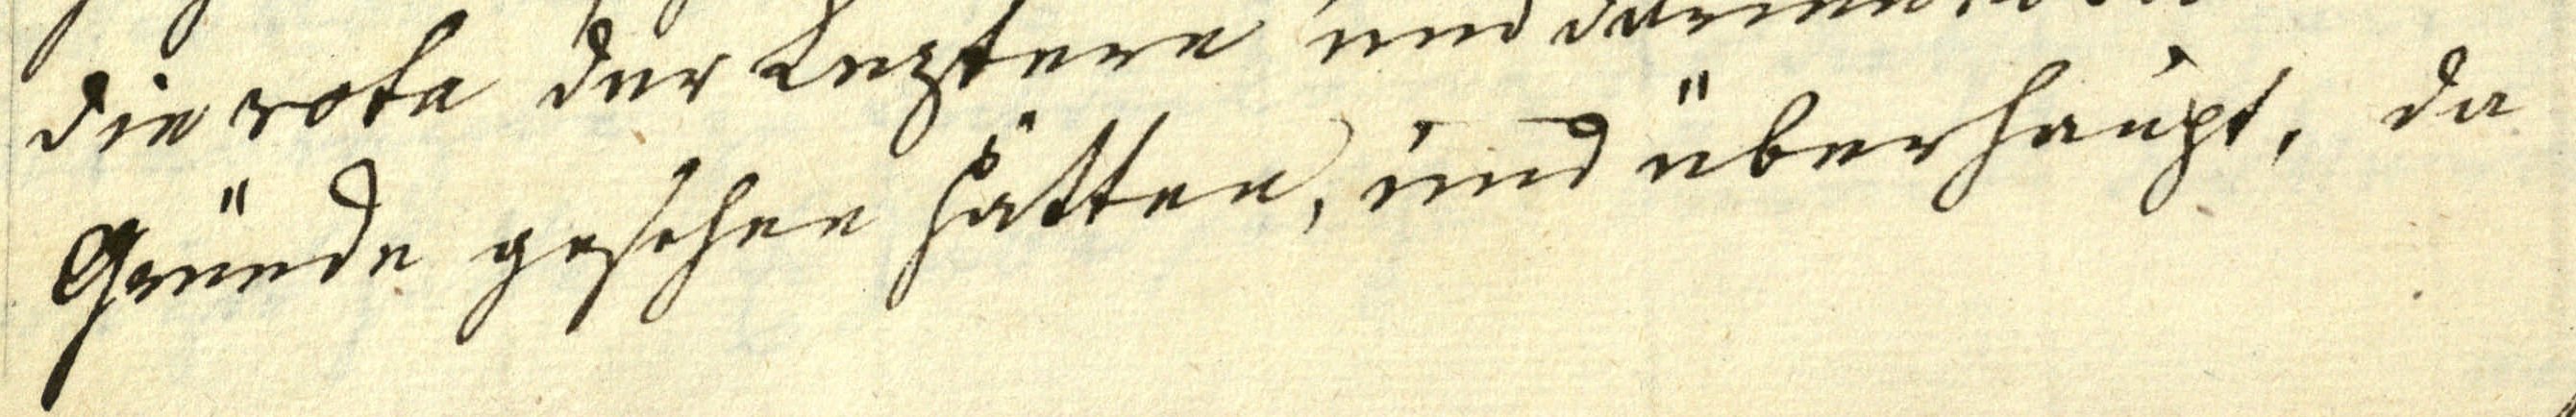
Gründe gesehen hätten, und überhaupt, da
